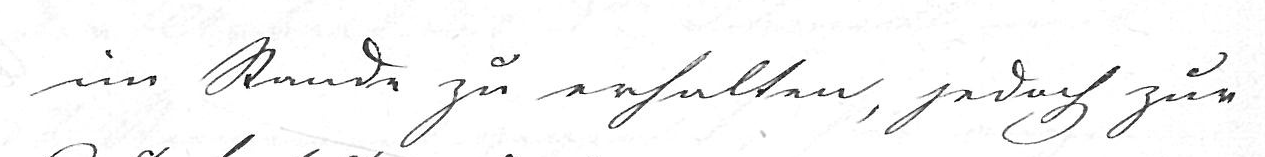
im Stande zu erhalten, jedoch zur
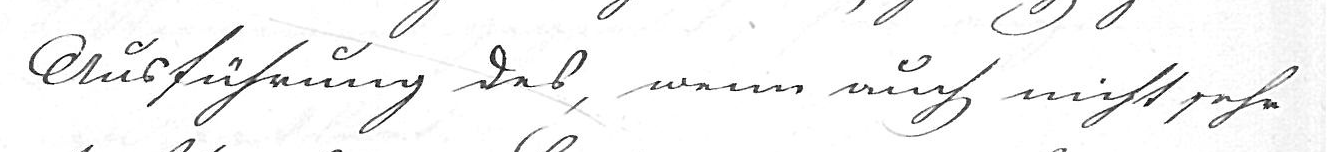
Ausführung des, wenn auch nicht sehr
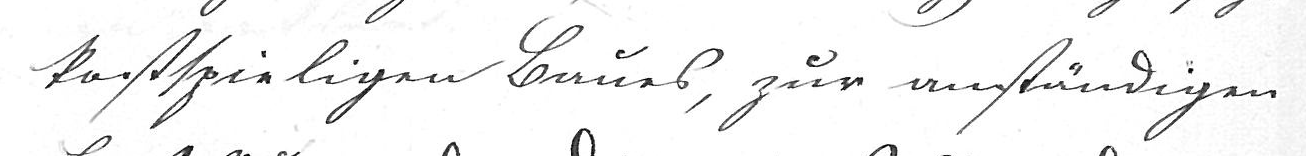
kostspieligen Baues, zur anständigen
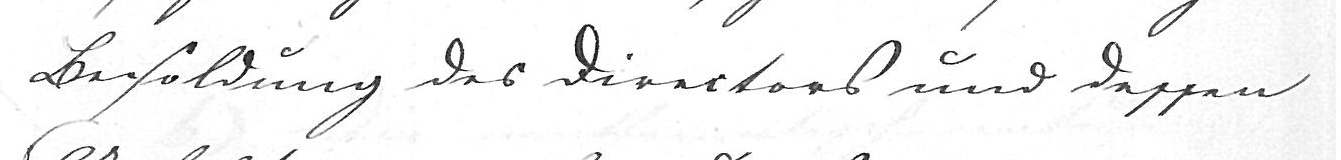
Besoldung des Directors und dessen
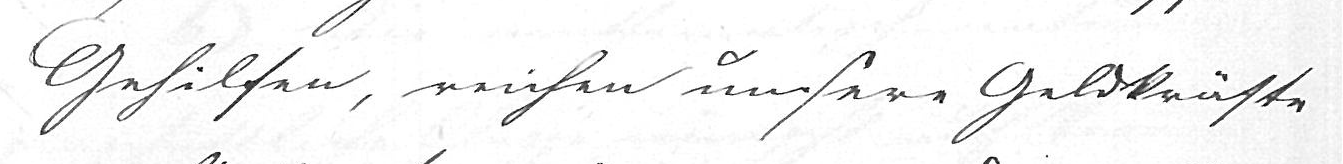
Gehilfen, reichen unsere Geldkräfte
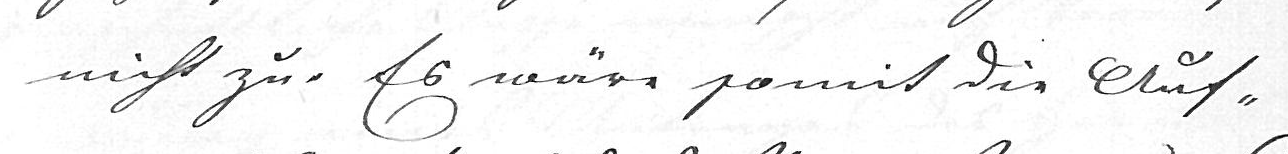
nicht zu. Es wäre somit die Auf-
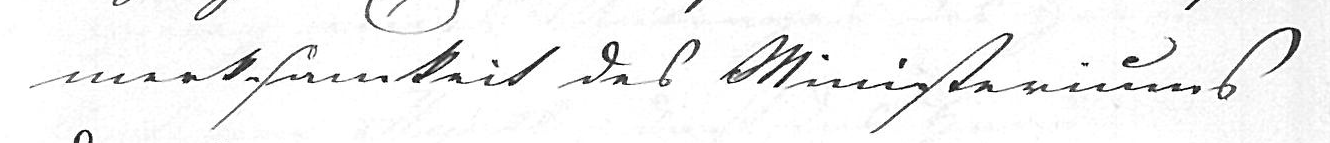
merksamkeit des Ministeriums
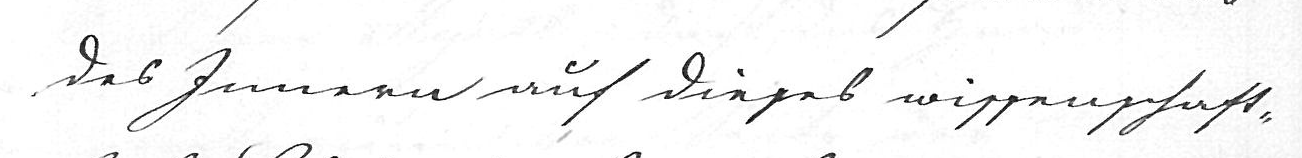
des Innern auf dieses wissenschaft-
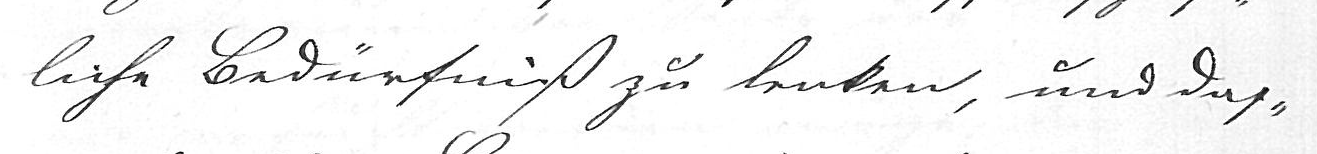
liche Bedürfniß zu lenken, und das-
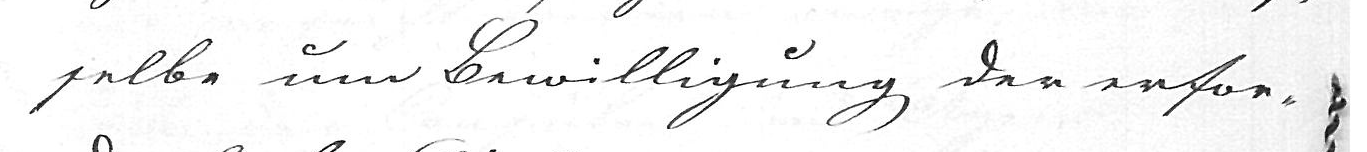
selbe um Bewilligung der erfor-
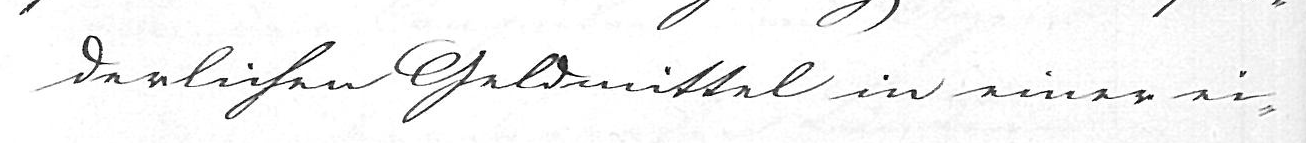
derlichen Geldmittel in einer ei-
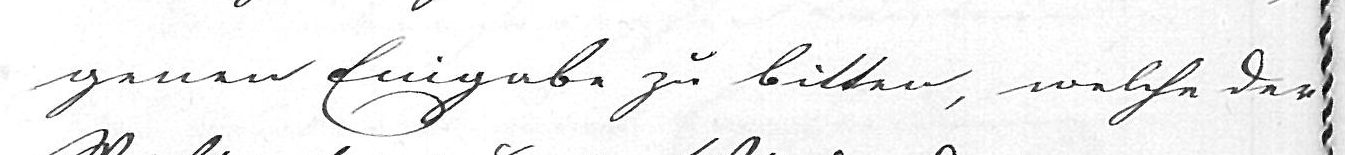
genen Eingabe zu bitten, welche der
